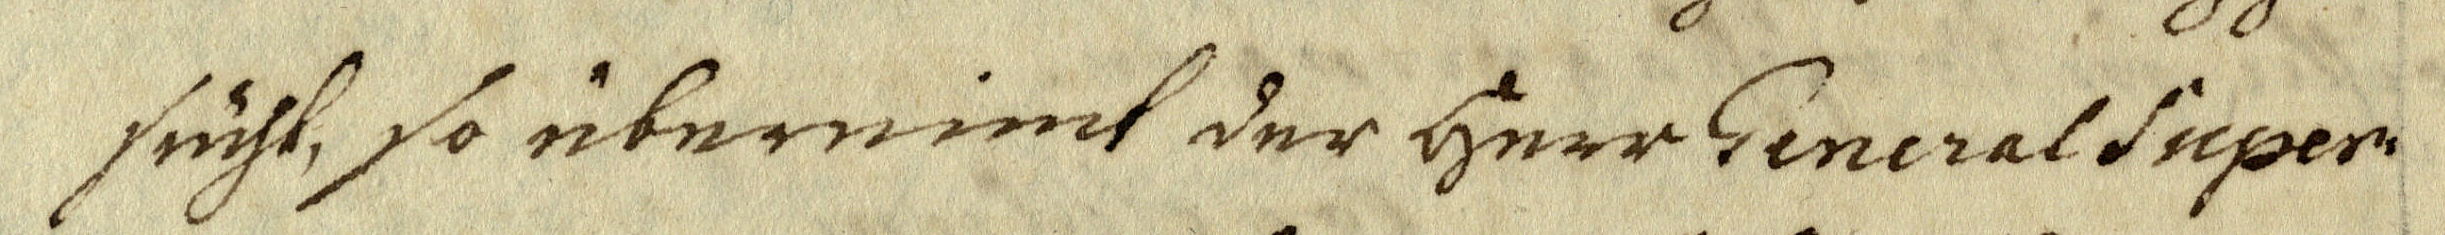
sucht, so übernimt der Herr GeneralSuper¬
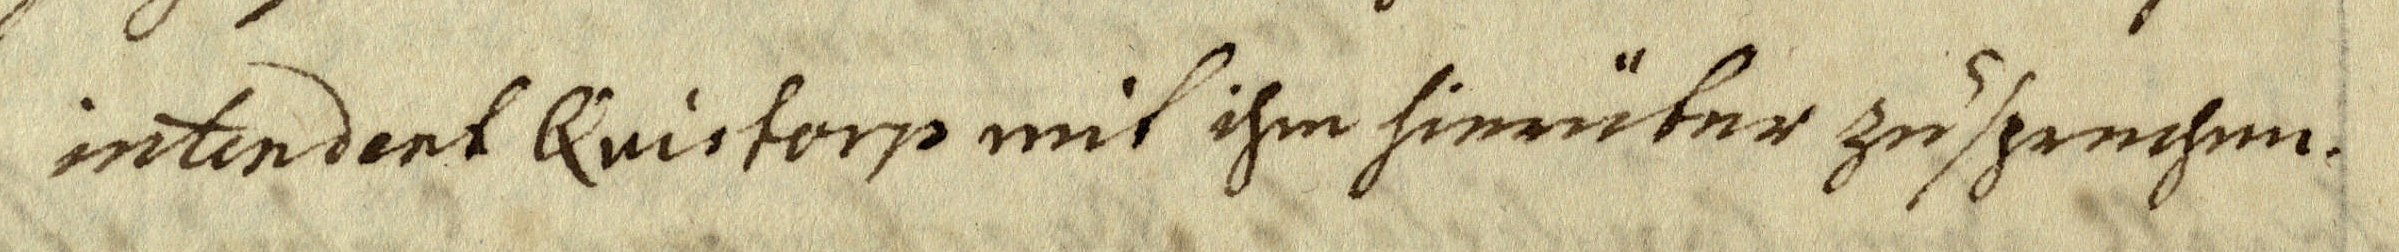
intendent Quistorp mit ihm hierüber zu sprechen.
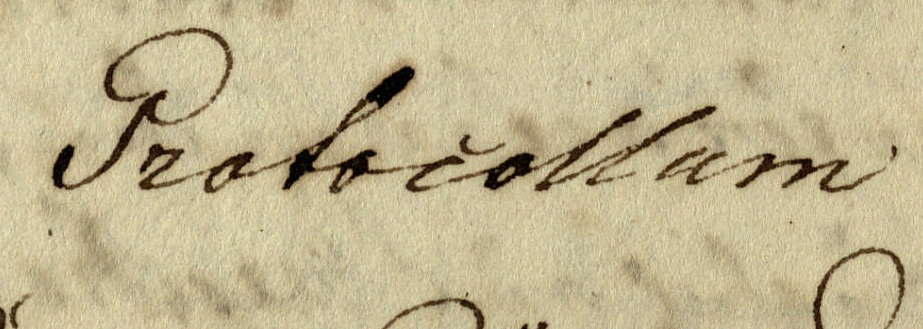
Protocollum
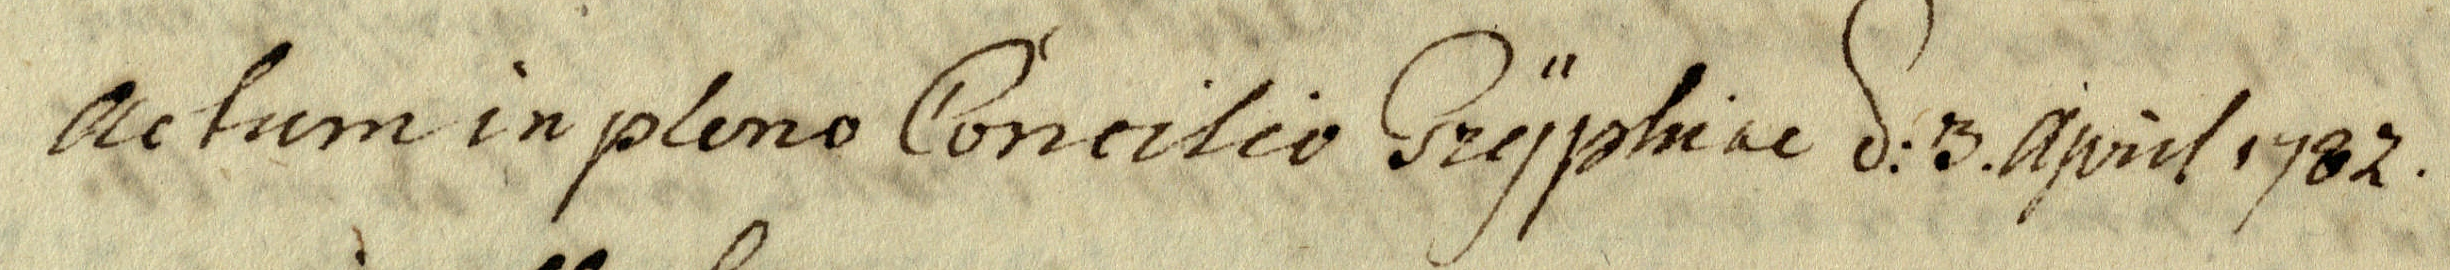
Actum in pleno Concilio Grÿphiae d. 3. April 1782.
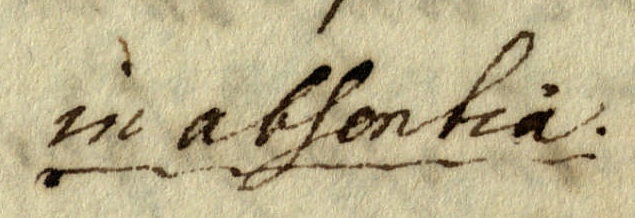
in absentia
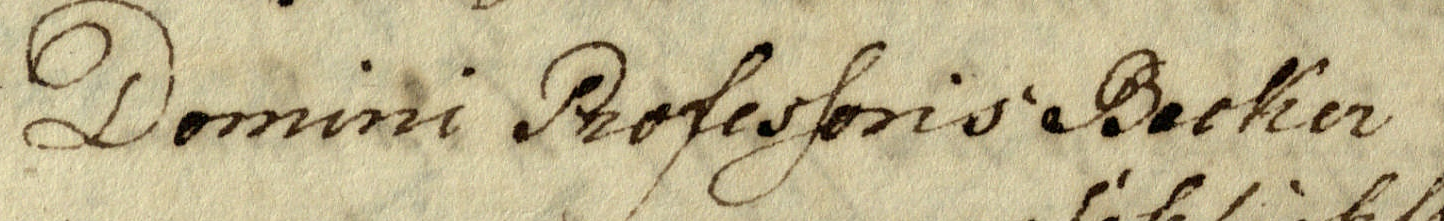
Domini Professoris Becker
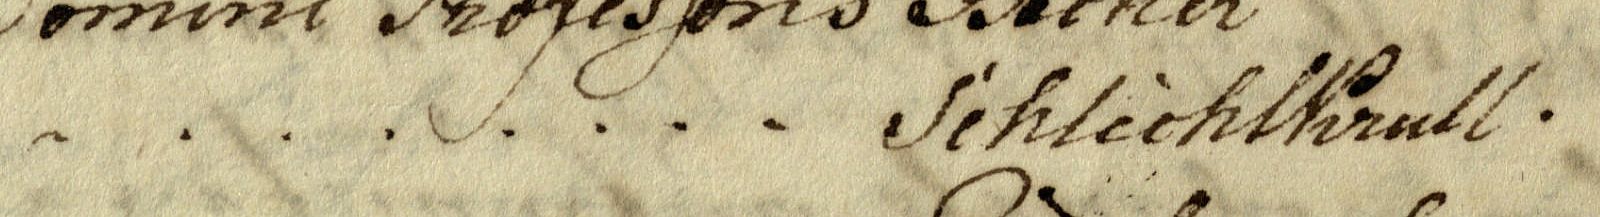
Schlichtkrull.
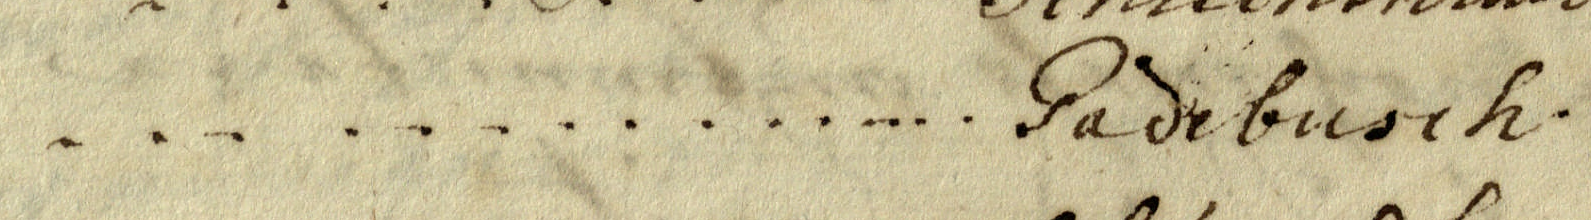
Gadebusch.
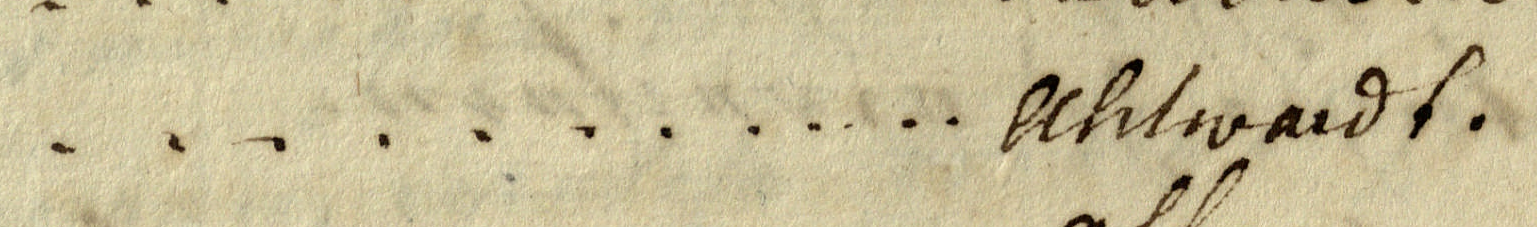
Ahlwardt.
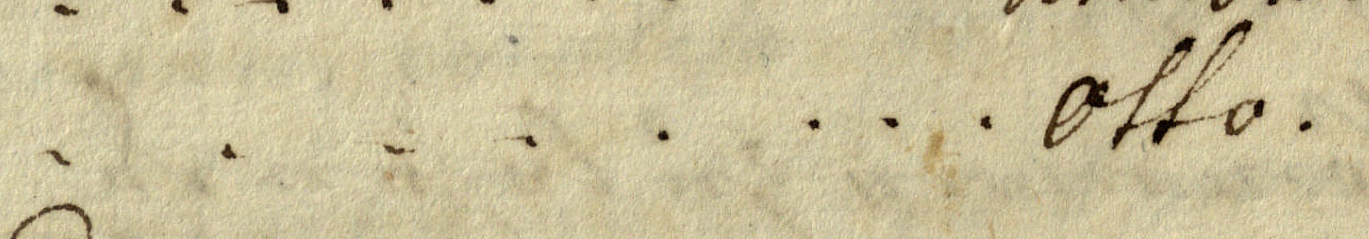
Otto.
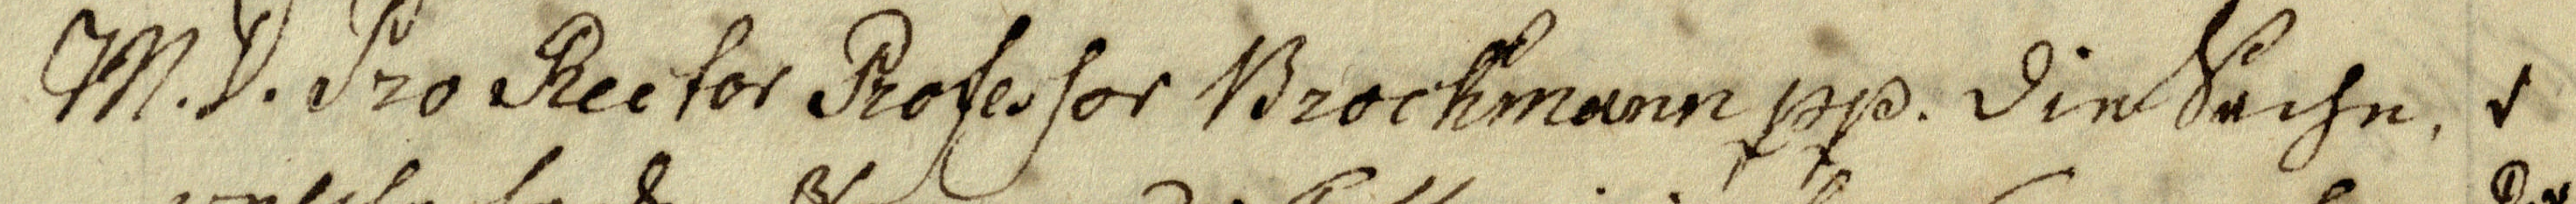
M. D. Pro Rector Professor Brockmann pp. Die Sache,
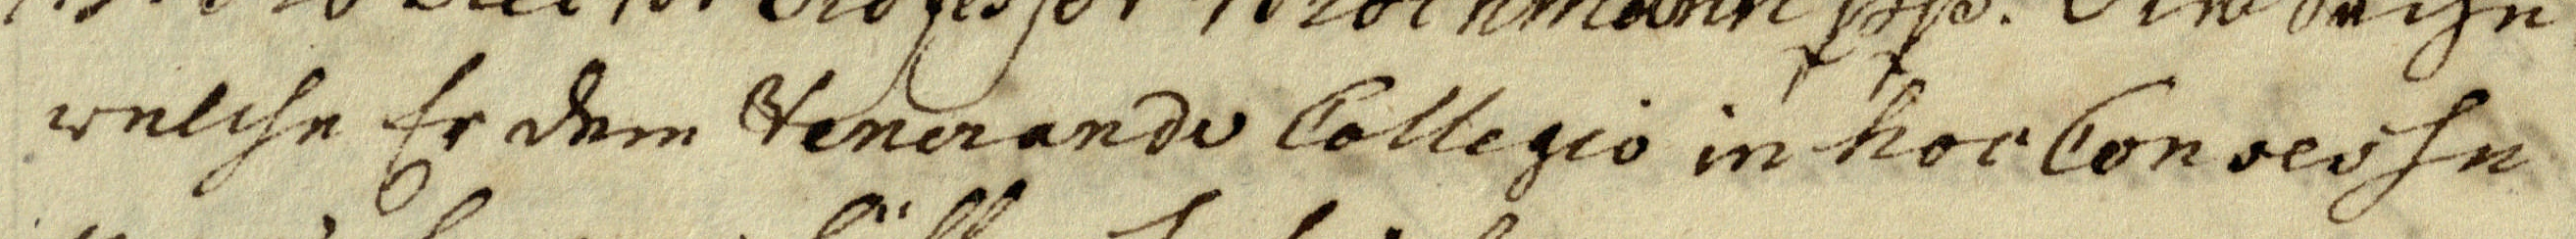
welche Er dem Venerando Collegio in hoc Consessu
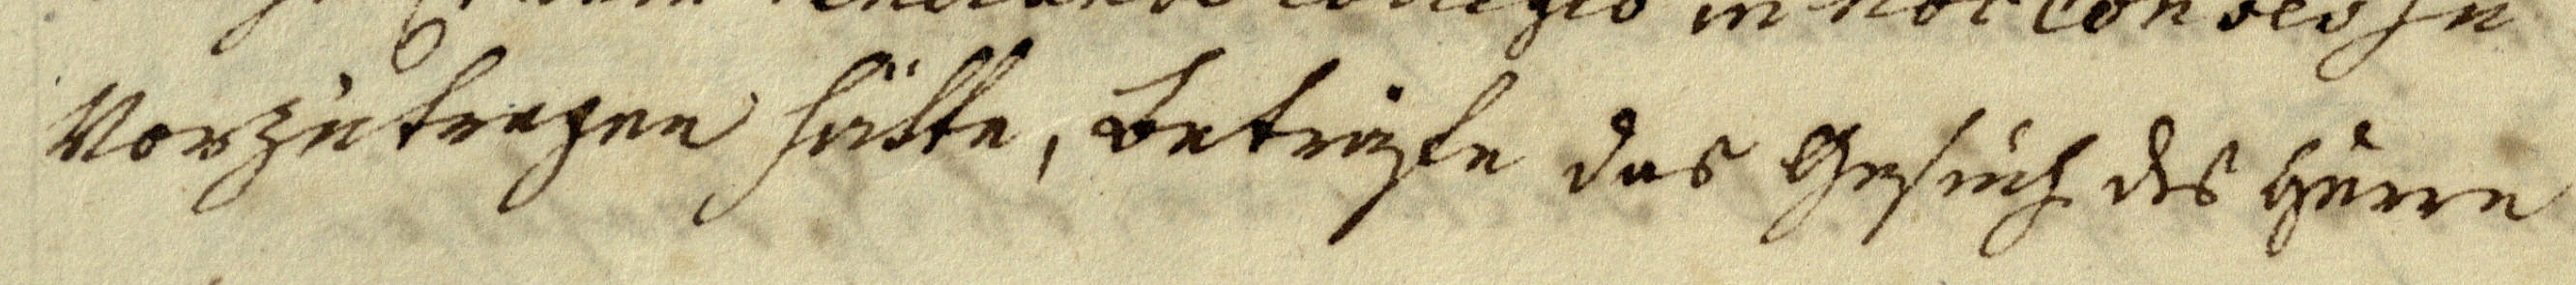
vorzutragen hätte, beträfe das Gesuch des Herrn
